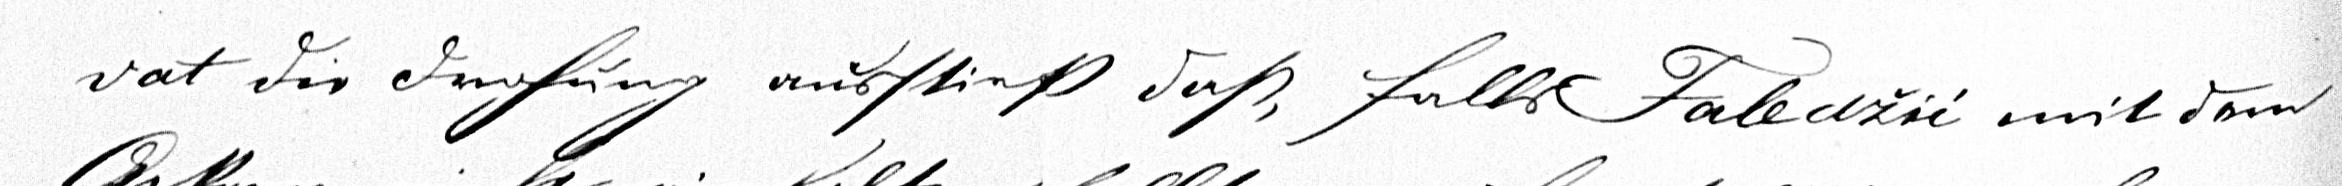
vat die Drohung ausstieß daß, falls Faledžić mit dem
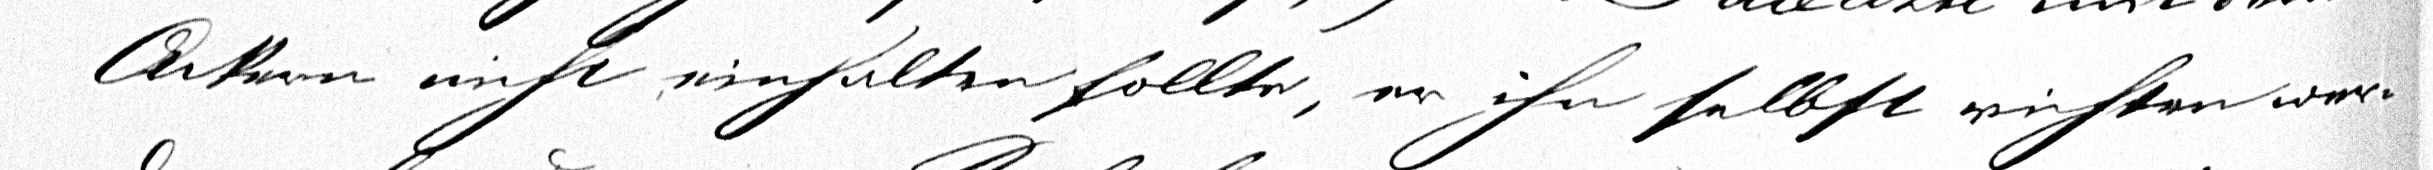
Ackern nicht einhalten follte, er ihn selbst richten wer¬
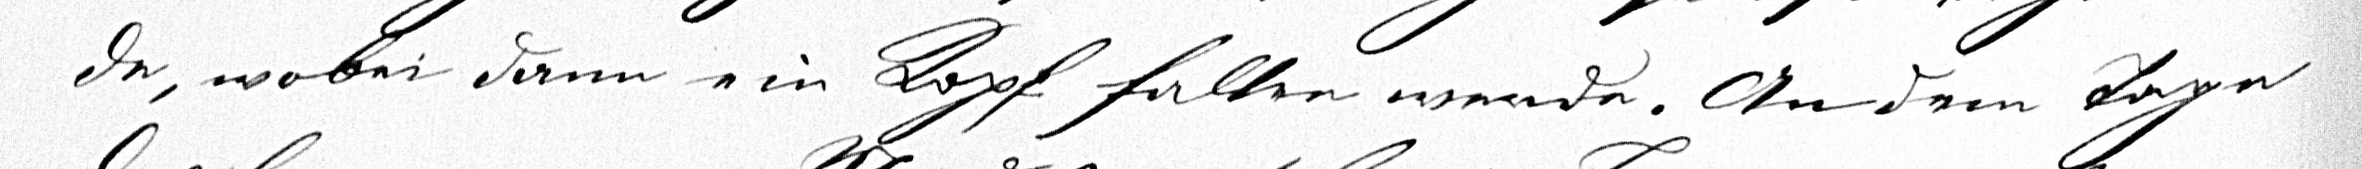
de, wobei dann ein Kopf falten werde. An dem Tage
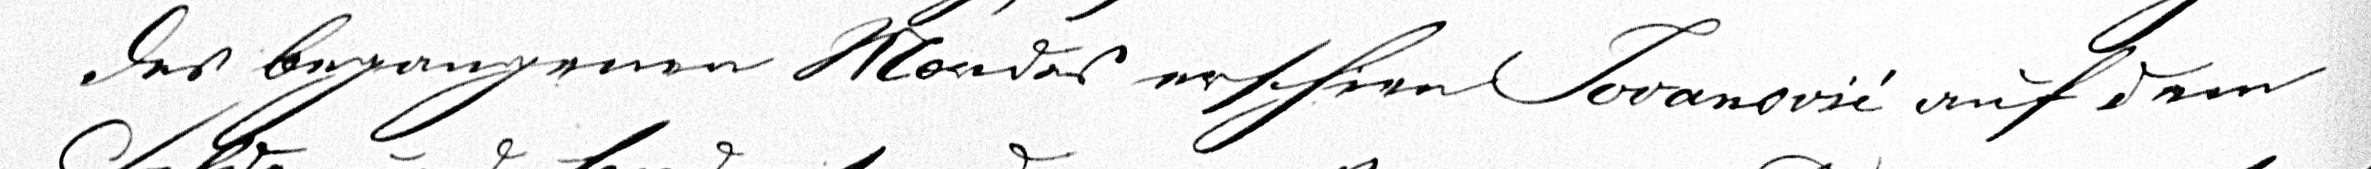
des begangenen Mordes erschien Jovanović auf dem
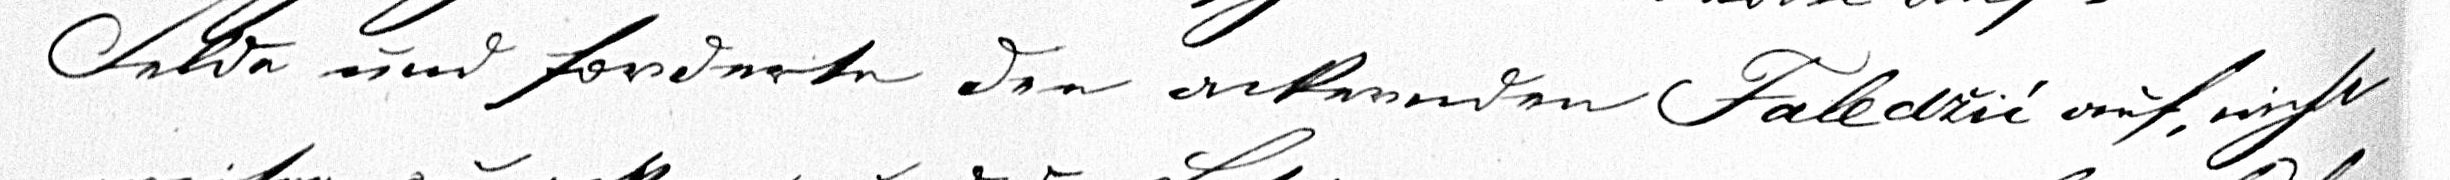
Felde und forderte der ackernden Faledžić auf, nicht
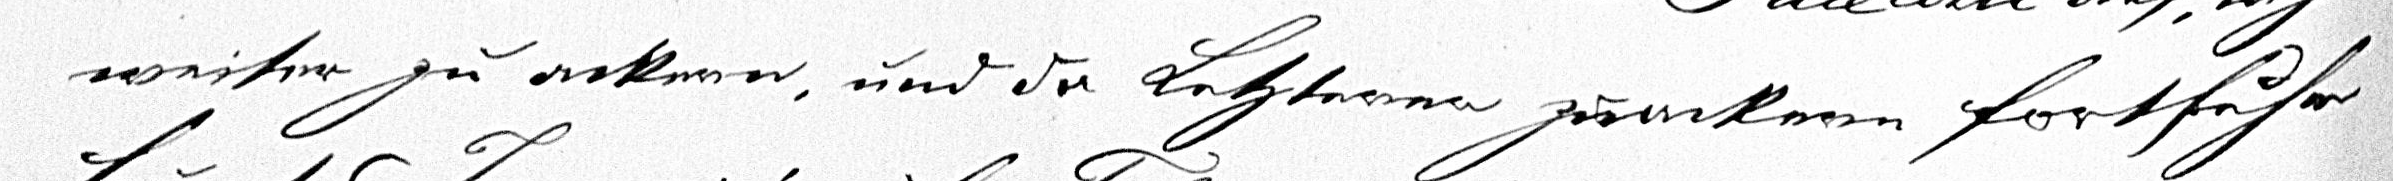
weiter zu ackern, und da Letzteren zuackern fortfuhr
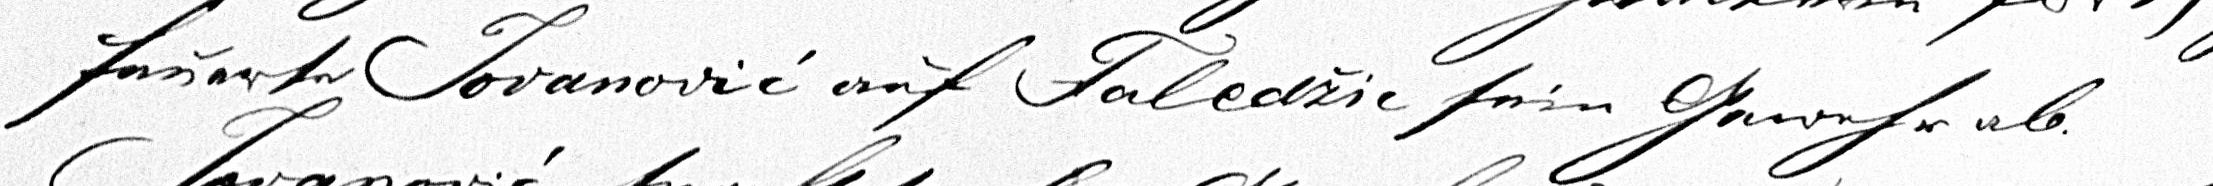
faserte Jovanović auf Faledžic sein Gewehr ab.
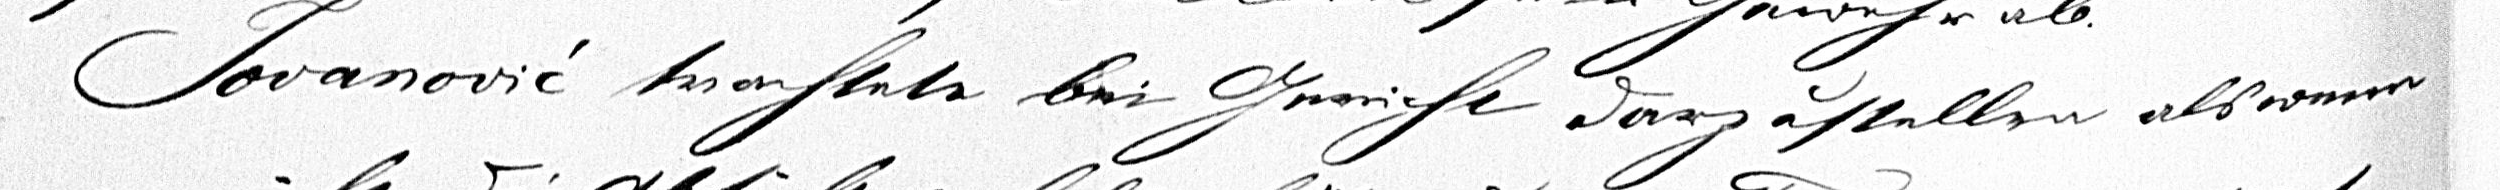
Jovanović trachtete bei Gericht darzustellen als wenn
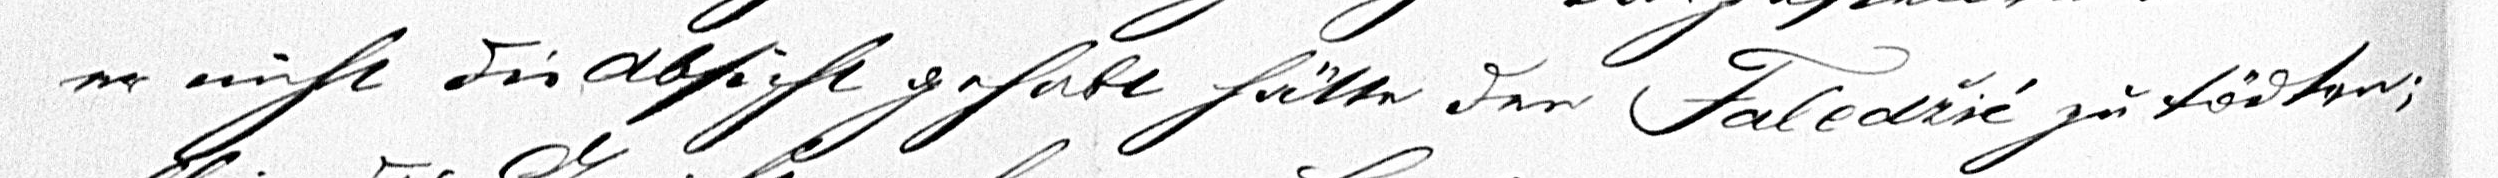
er nicht die Absicht gehabt hätte den Faledžić zu tödten;
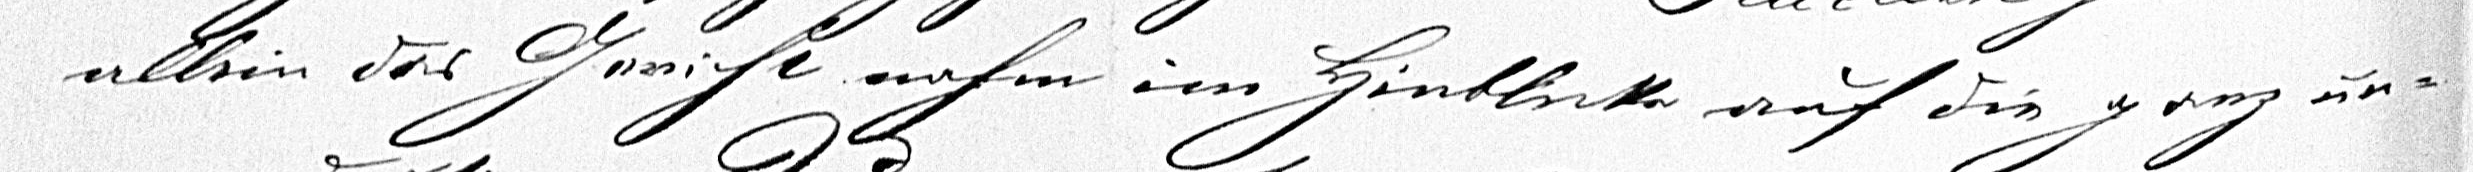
allein das Gericht nahm im Hinblicke auf die ganz un¬
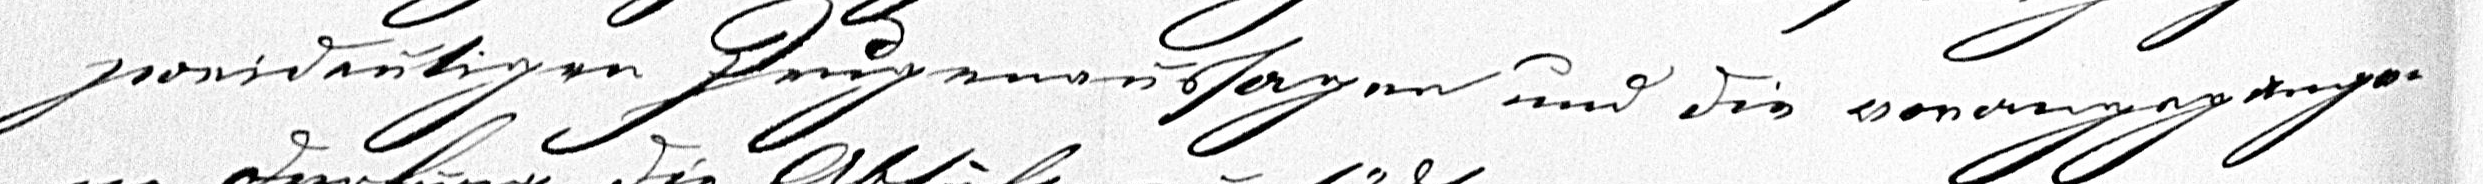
zweideutigen Zeugenaussagen und die vorangegange¬
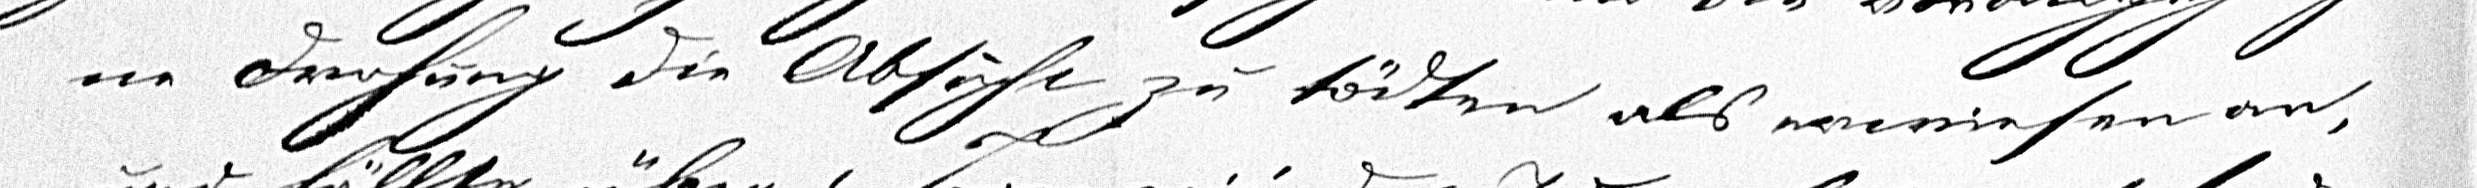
ne Drohung die Absicht zu tödten als verwiesen an,
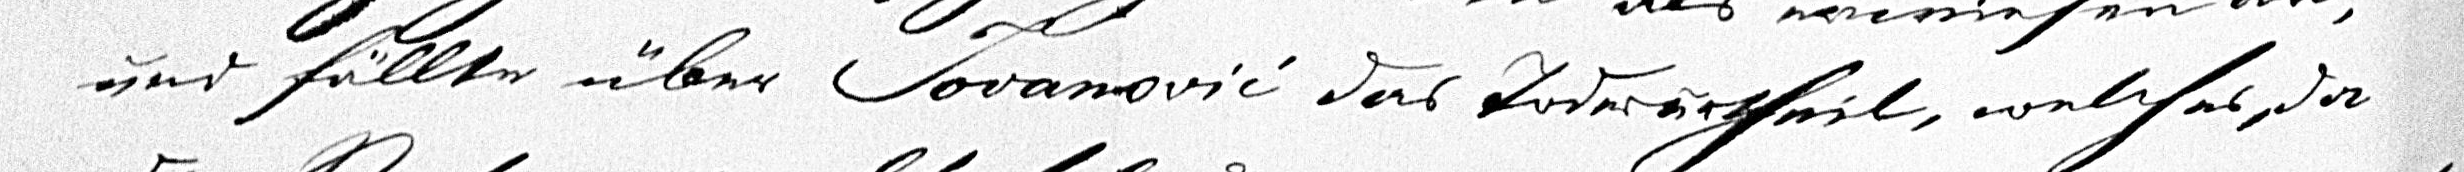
und fällte über Jovanović das Todesurtheil, welches, da
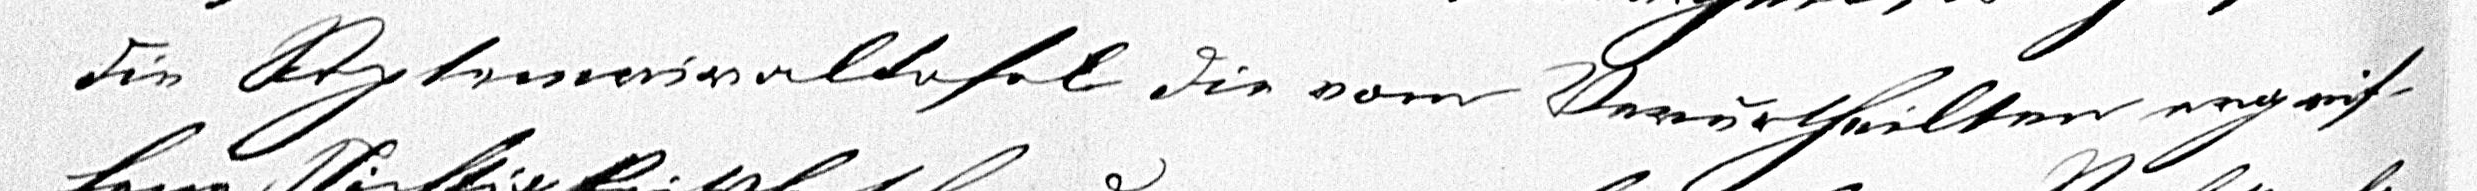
die Septemviraltafel die vom Verurtheilten ergrif¬
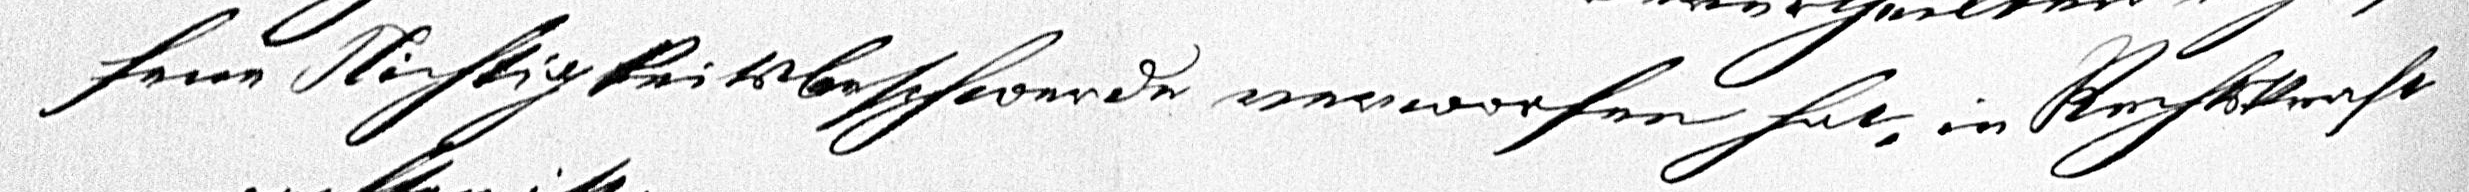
fene Nichtigkeitsbeschwerde verworfen hat, in Rechtskraft
